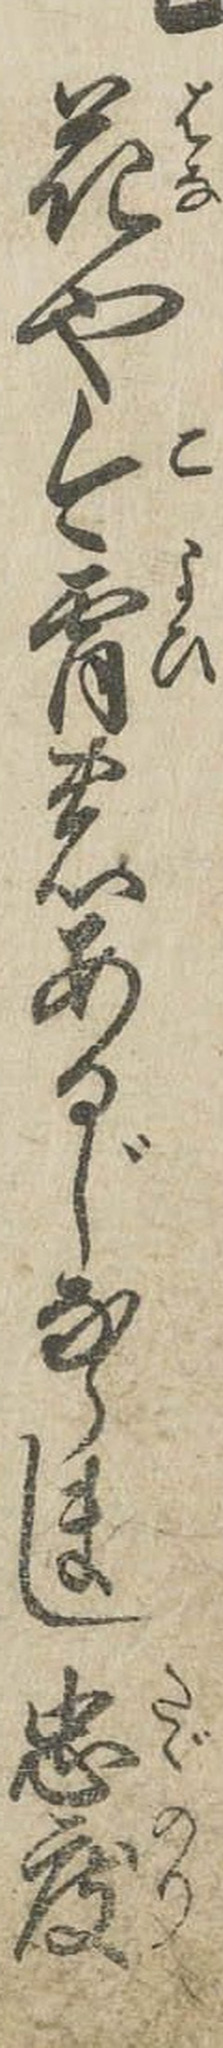花や今宵のあるじならまし忠度

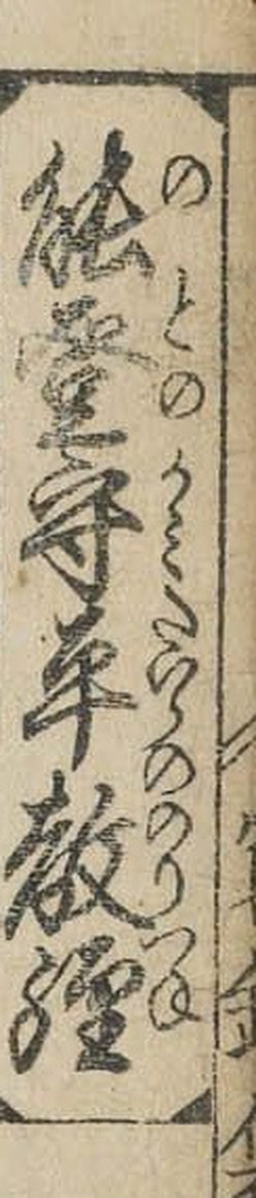能登守平教経
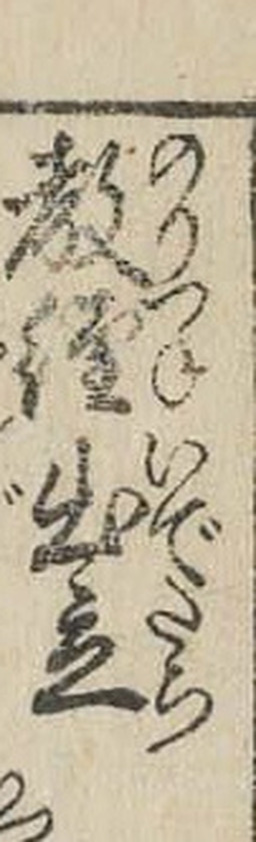教経出立
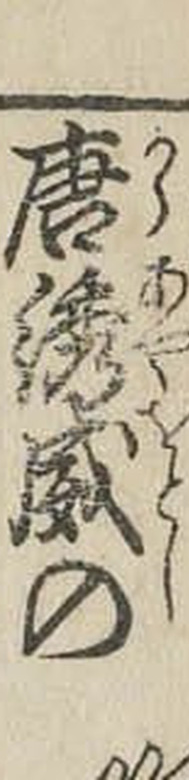唐繍威の
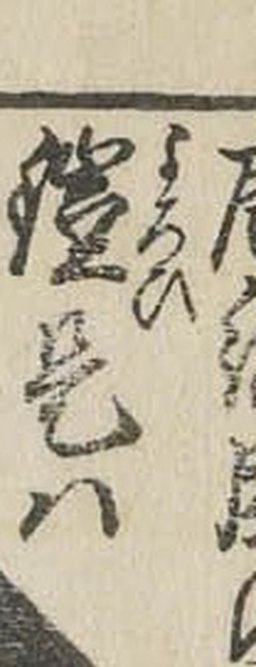鎧是は
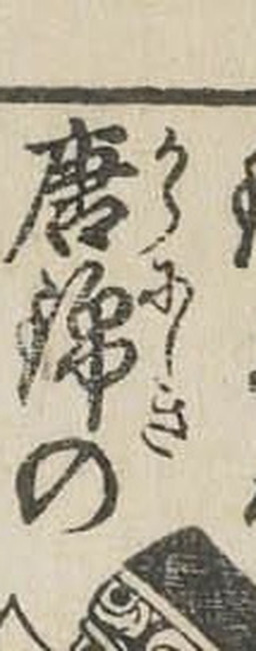唐錦の
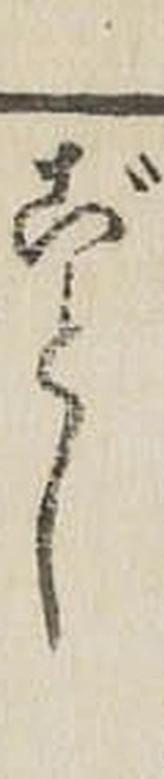ごとし
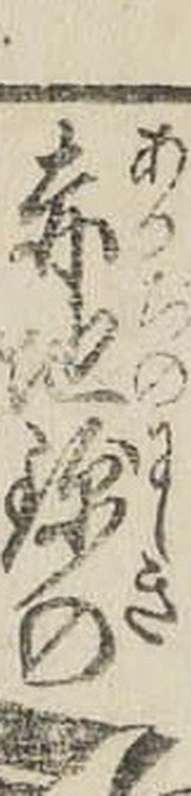赤地錦の
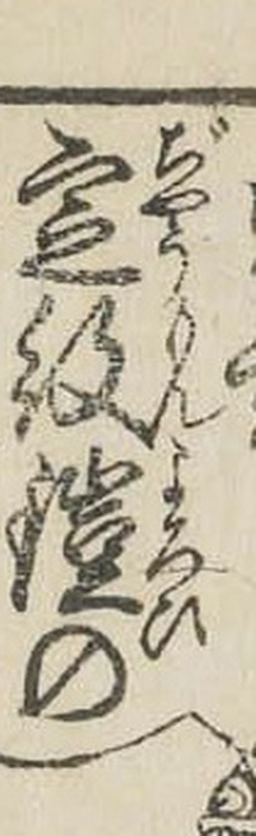定紋鎧の
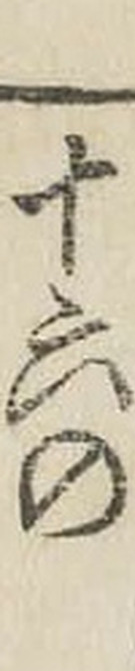十六の
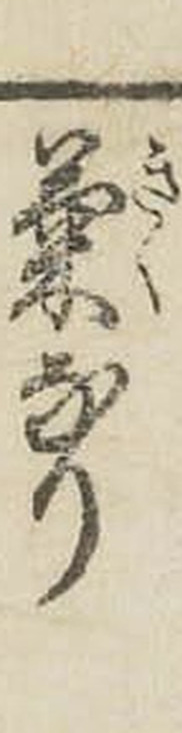菊なり
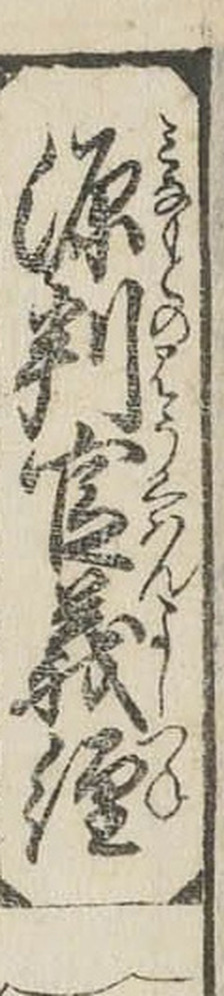源判官義経
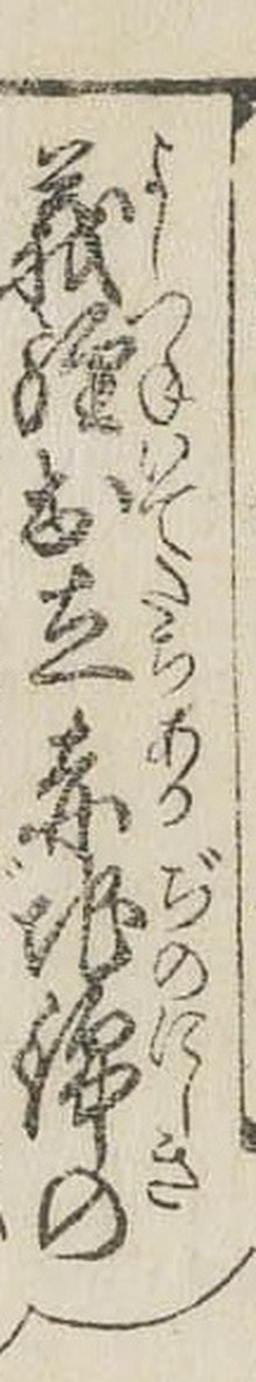義経出立赤地錦の
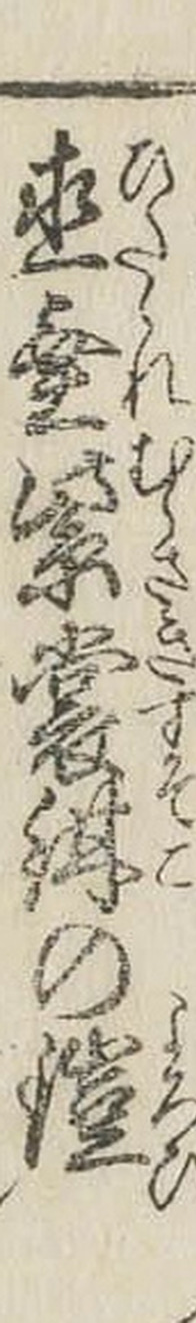直垂紫裳紺の鎧
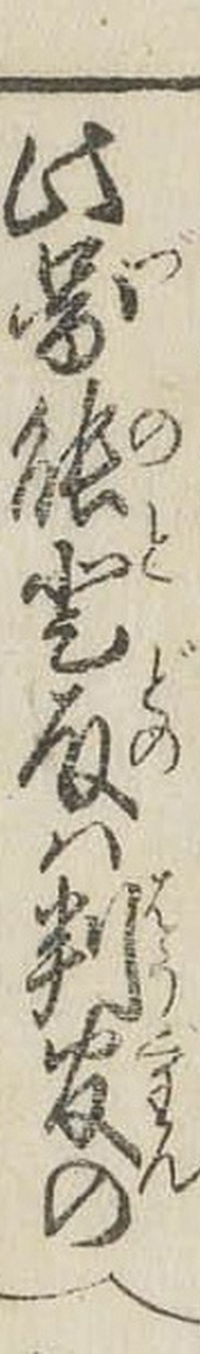此図能登殿は判官の
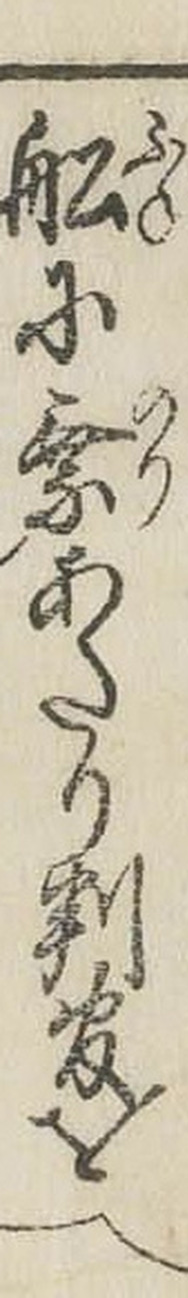船に乗あたり判官を
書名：絵本写宝袋 9巻 3之巻
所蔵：東京学芸大学教育コンテンツアーカイブ
